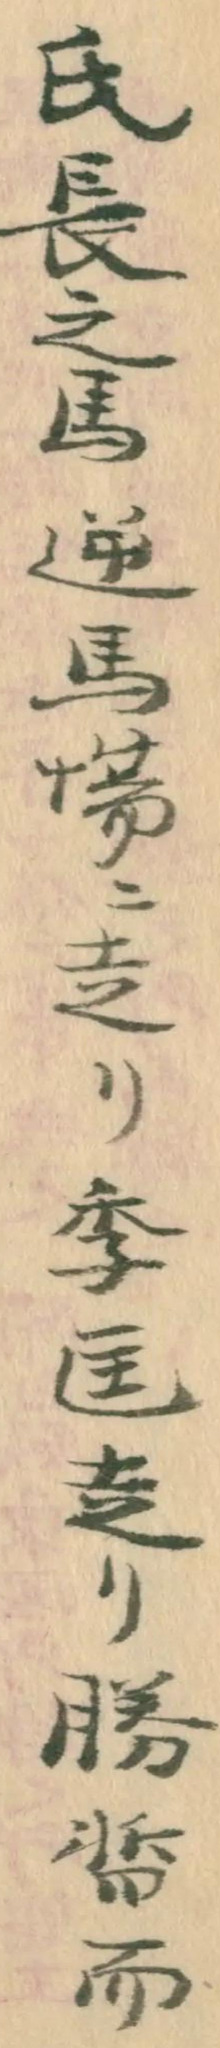氏長之馬逆馬場ニ走リ季匡勝暫而
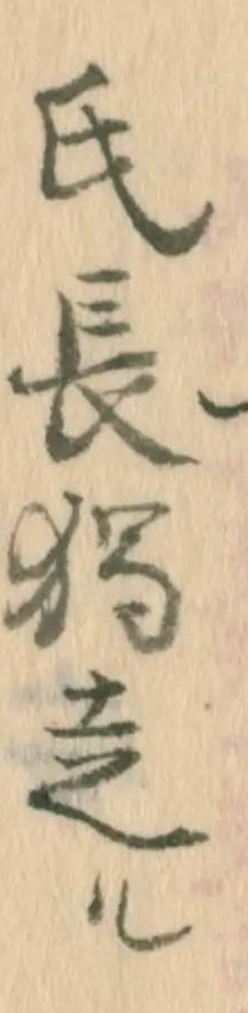氏長独走ル
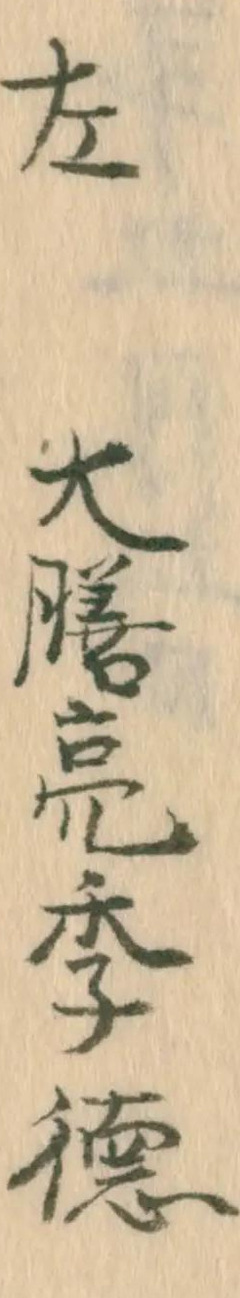左大膳亮季徳
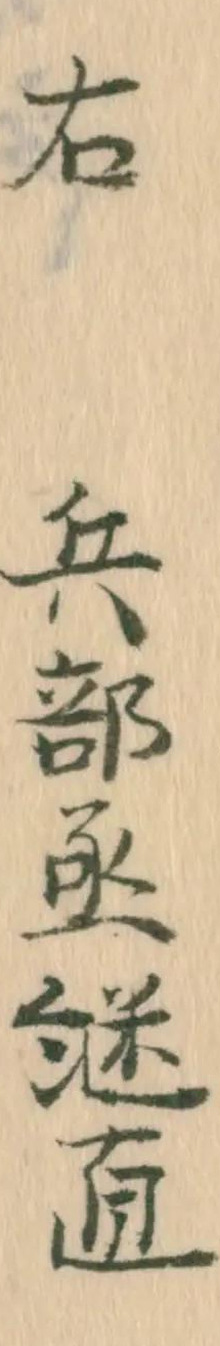右兵部丞継直
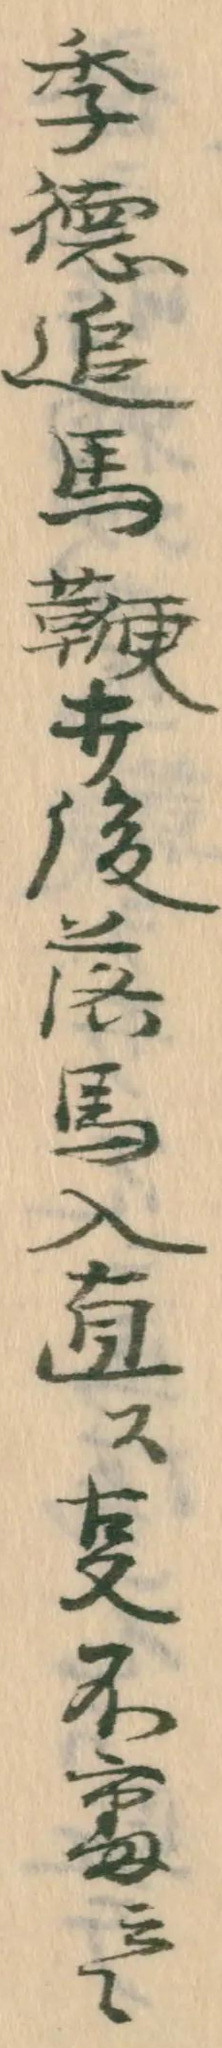季徳追馬鞭打後落馬入直ス事不審云々
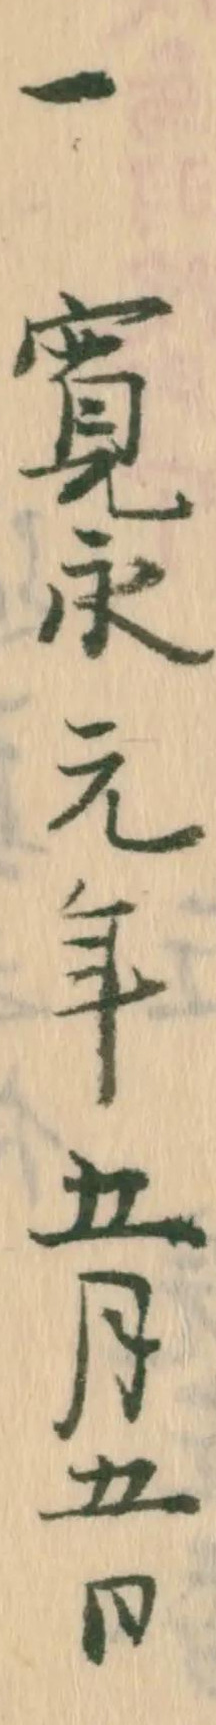一寛永元年五月五日
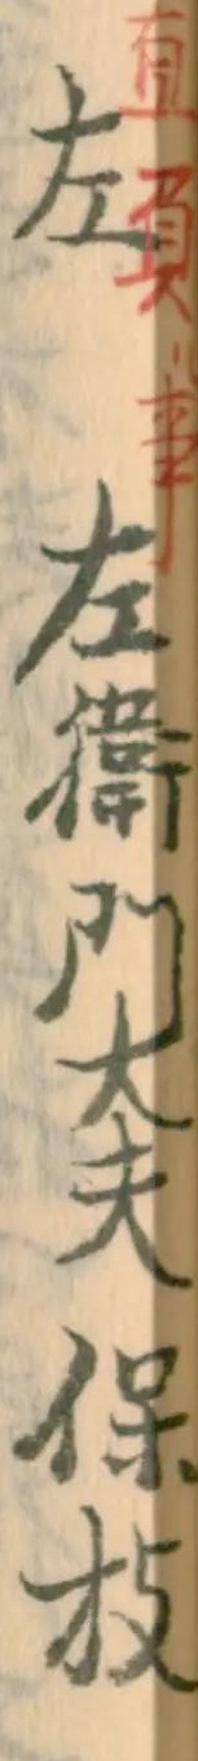左佐衛門大夫保枝
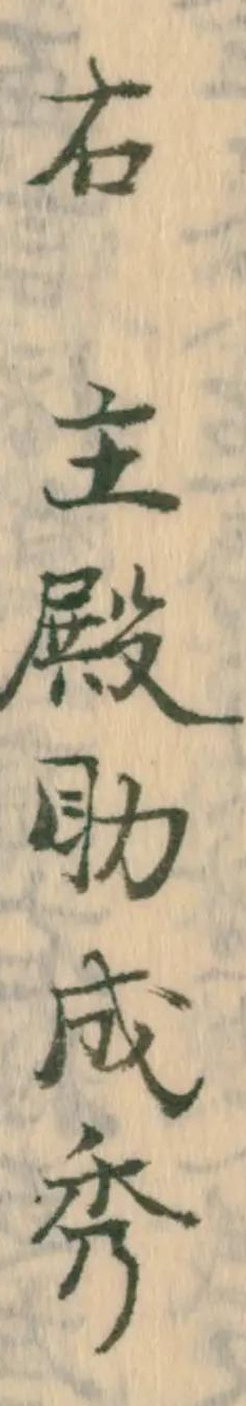右主殿助成秀
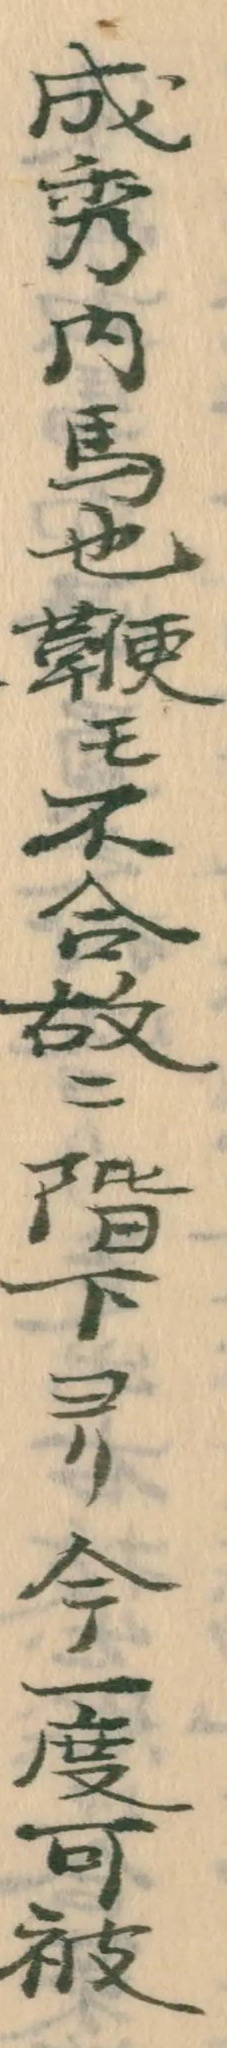成秀内馬也鞭モ不合故ニ階下ヨリ今一度可被
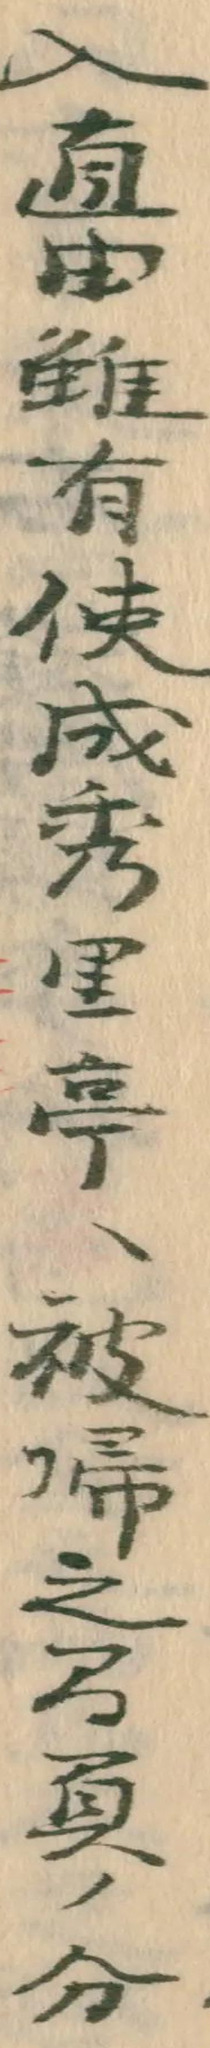入直由雖有使成秀里亭へ被帰之間負ノ分
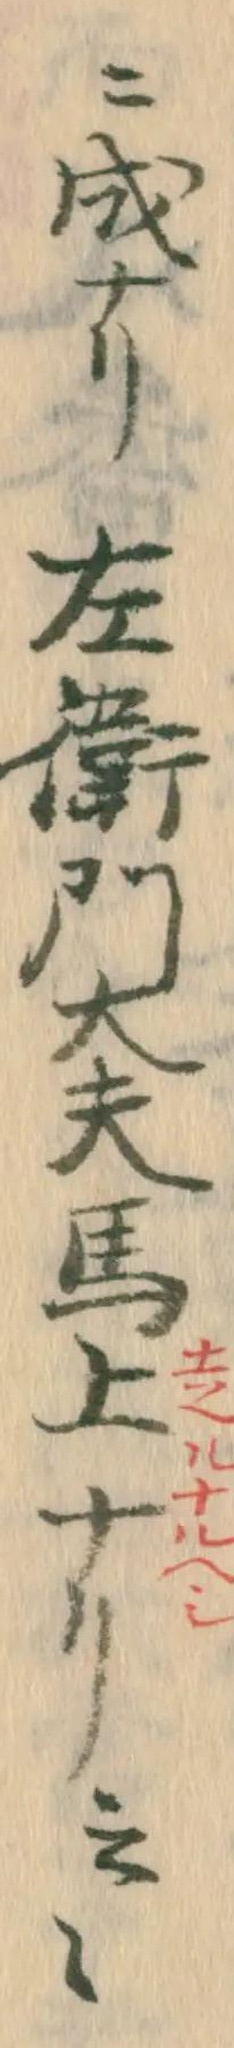ニ成リ左衛門大夫馬上ナリ云々
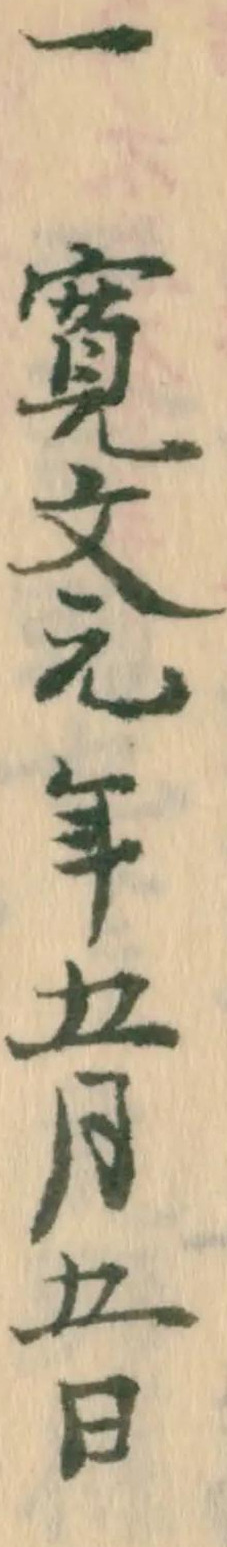一寛永元年五月五日
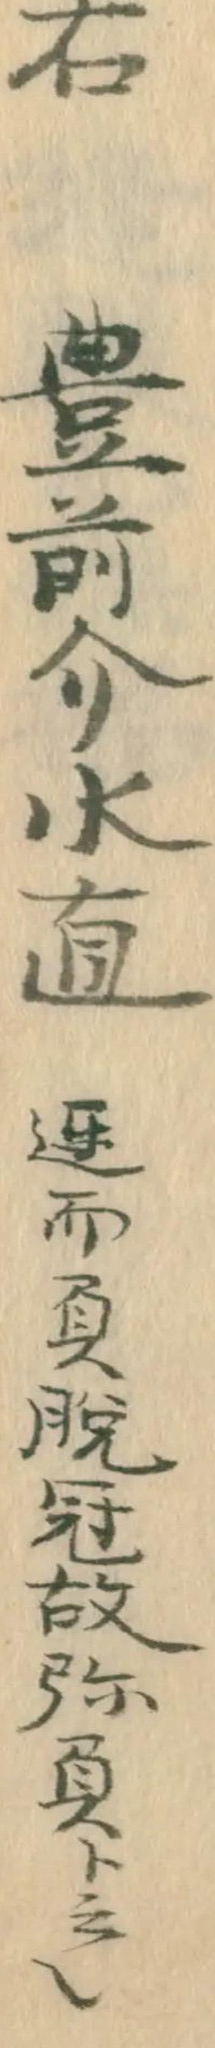右豊前介水直遅而負脱冠故弥負ト云々

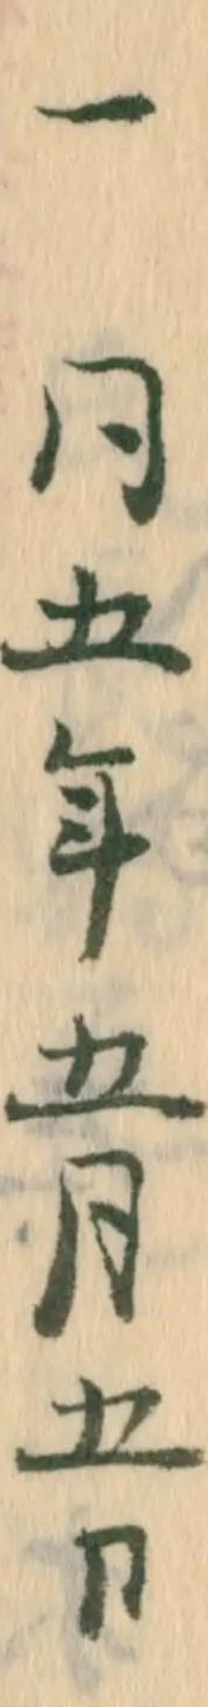一同五年五月五日
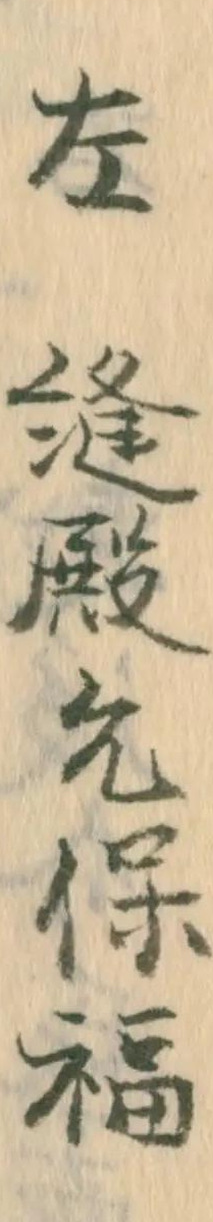右縫殿允保福
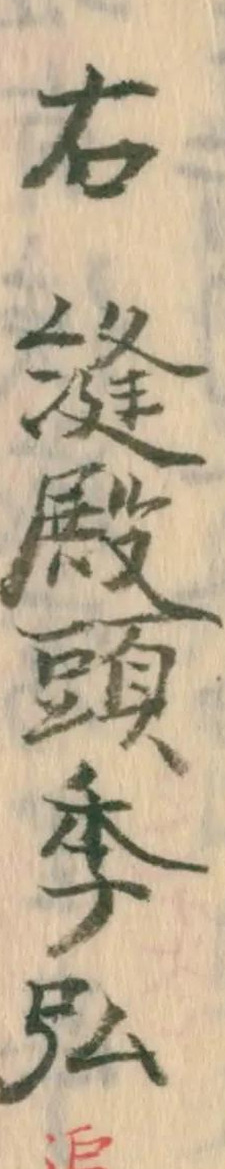右縫殿頭季弘
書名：賀茂社記録. 第12冊
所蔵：国立国会図書館 National Diet Library, JAPAN
